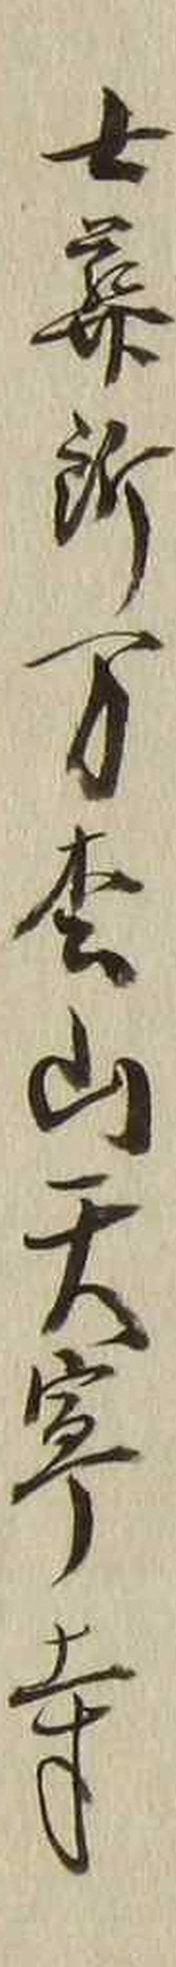士葬所万杢山天寧寺

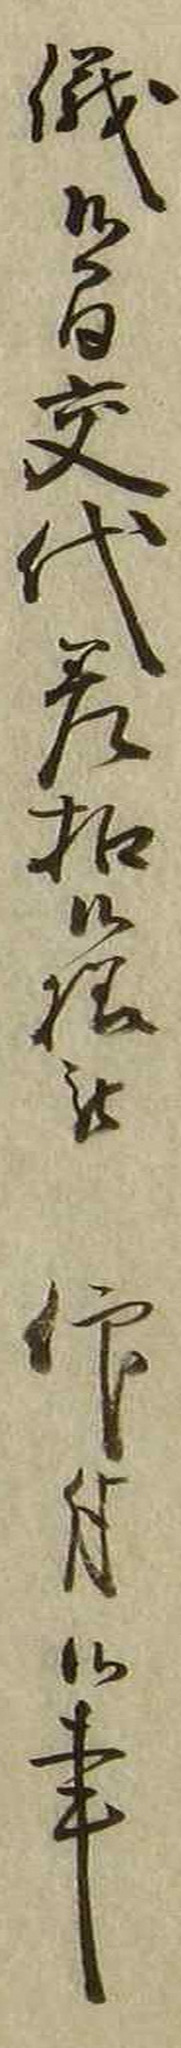儀候間交代差扣候様被仰付候事
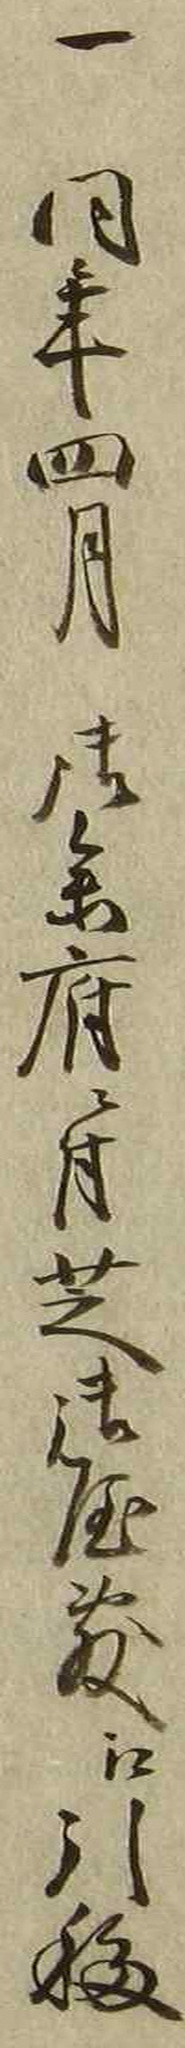一同年四月御参府ニ付芝御屋敷江引移
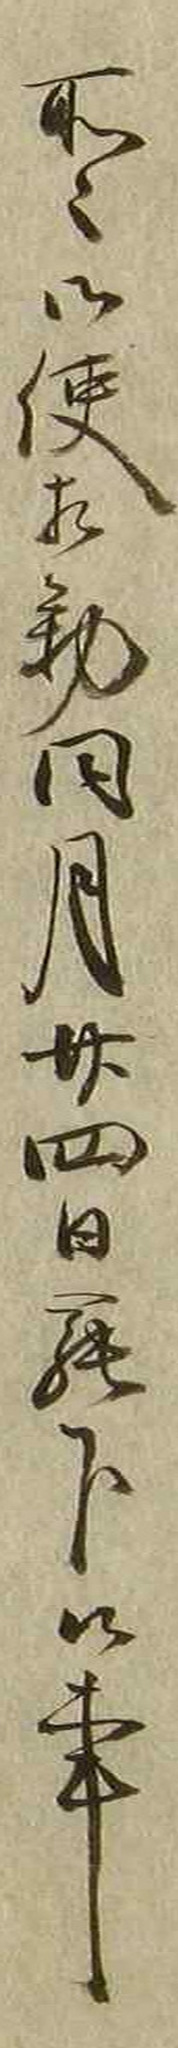所々御使相勤同月廿四日罷下候事
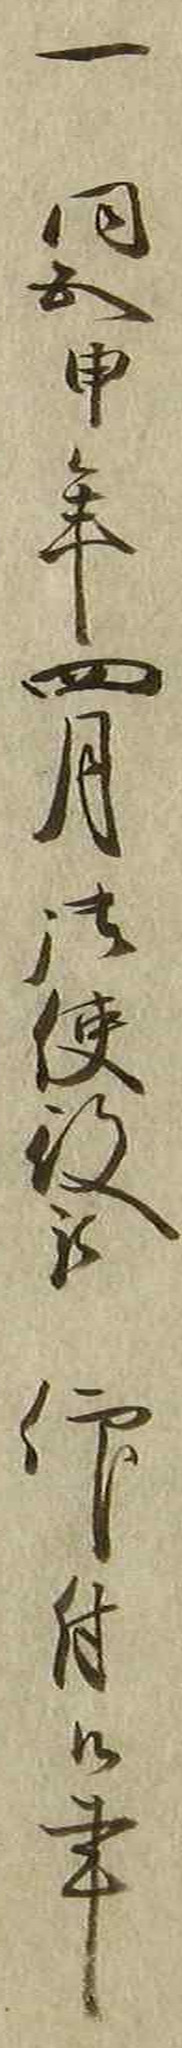一同五申年四月御使役被仰付候事
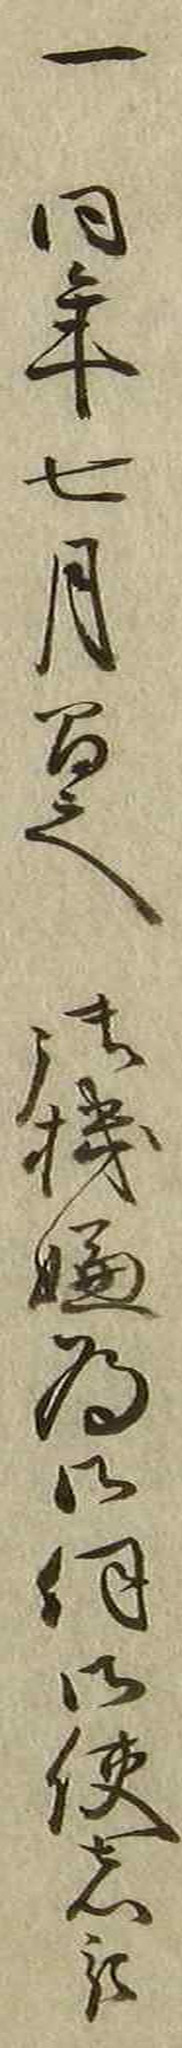一同年七月間之御機嫌為御伺御使者被
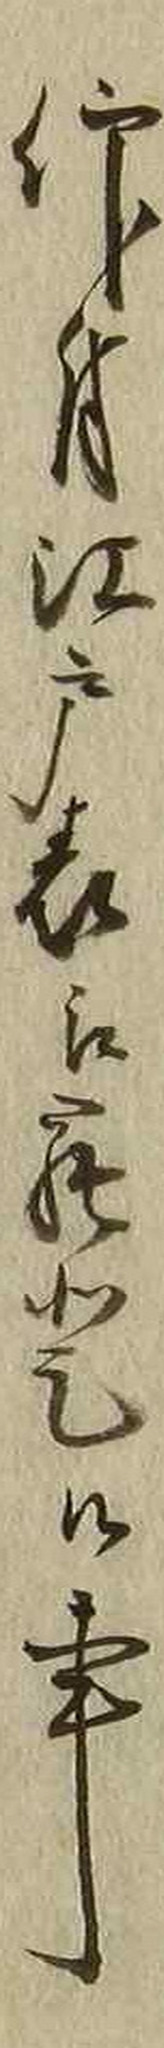仰付江戸表江罷登候事
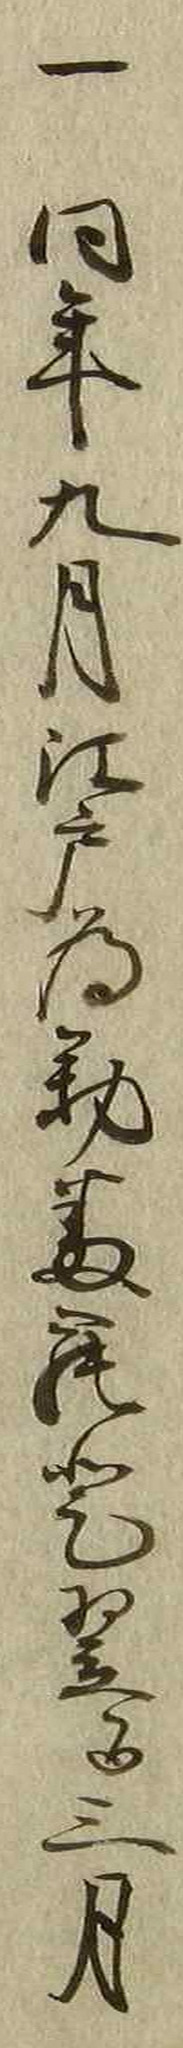一同年九月江戸為勤番罷登翌酉三月
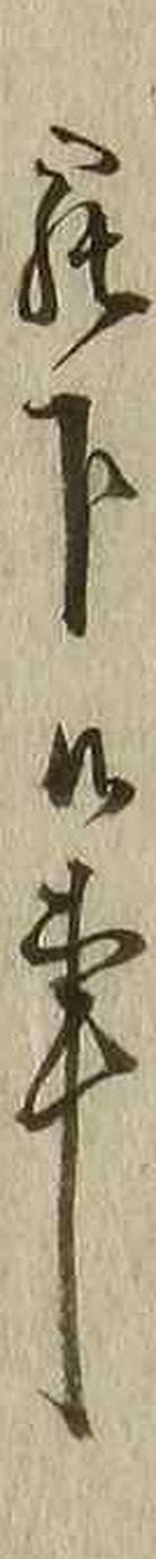罷下候事
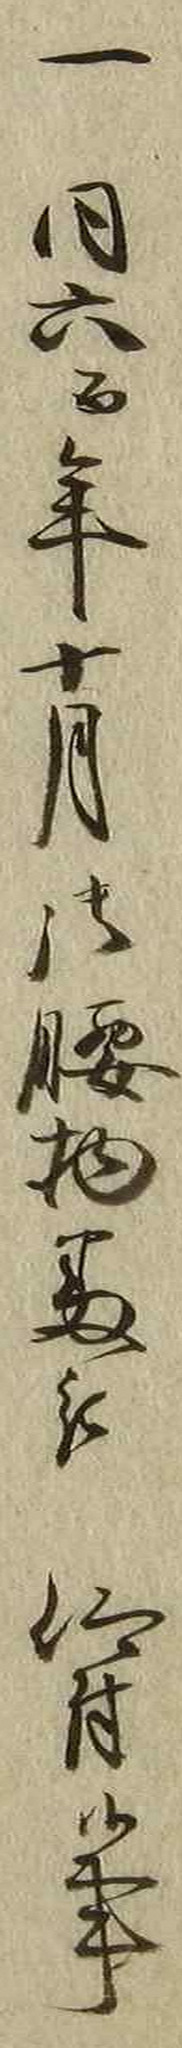一同六酉年十月御腰物番被仰付候事
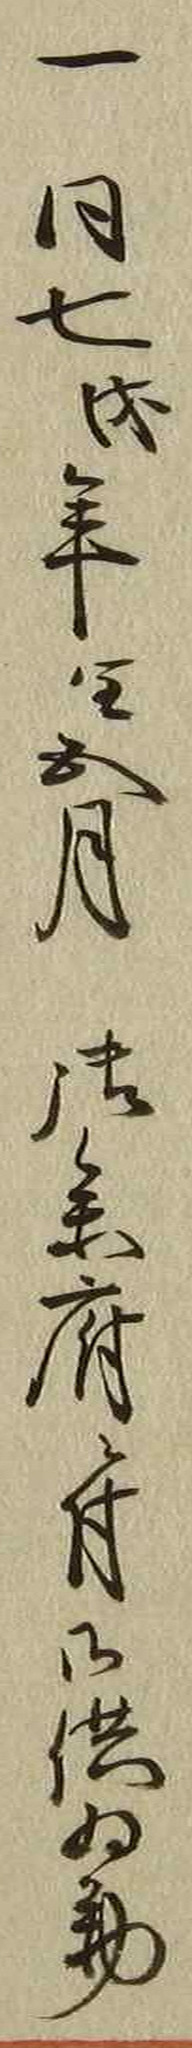一同七戌年閏五月御参府ニ付御供為勤
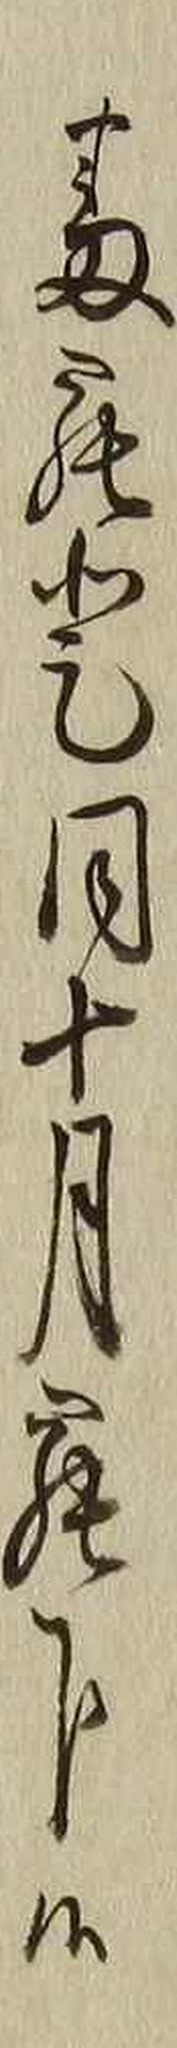番罷登同十月罷下候
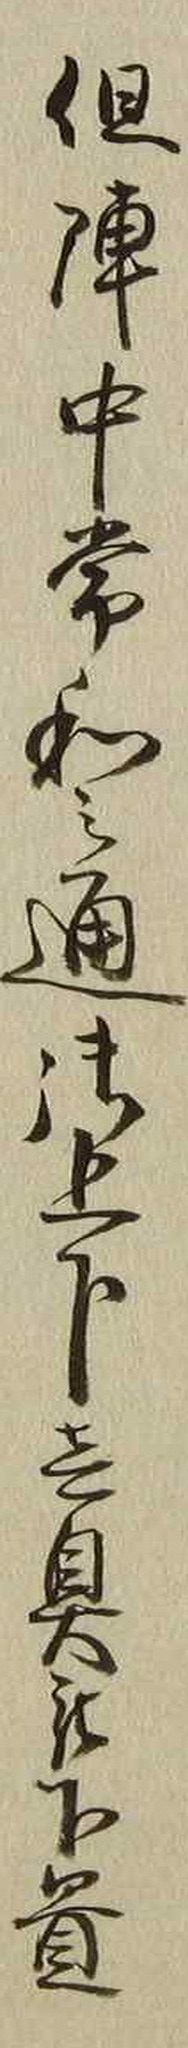但陣中常和之通御上下壱具被下置
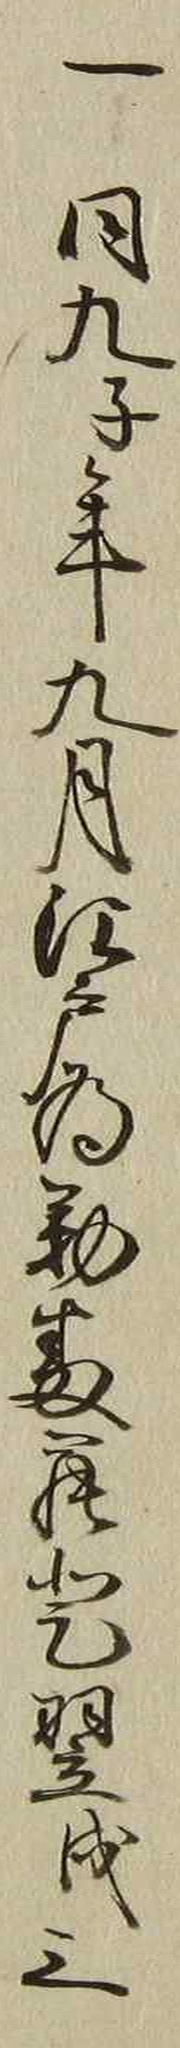一同九子年九月江戸為勤番罷登翌戌三
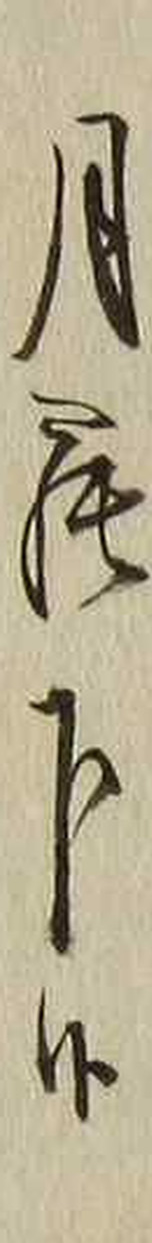月罷下候
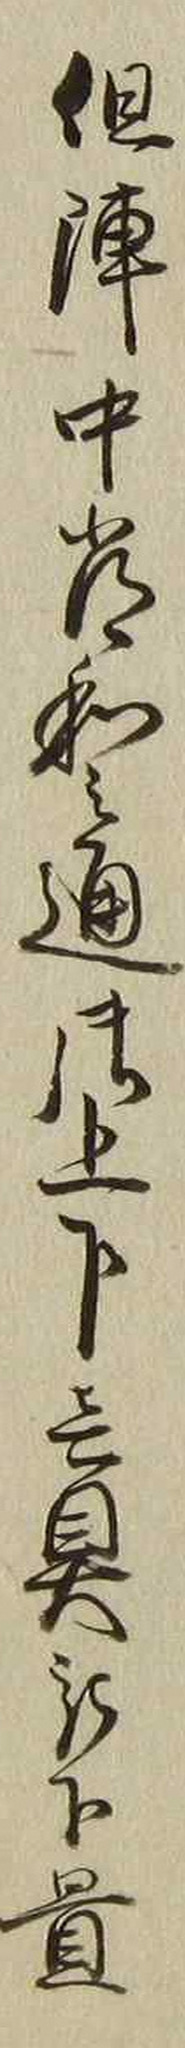但陣中常和之通御上下壱具被下置
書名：諸士系譜　巻之65　ち之部1
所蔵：会津若松市立会津図書館
